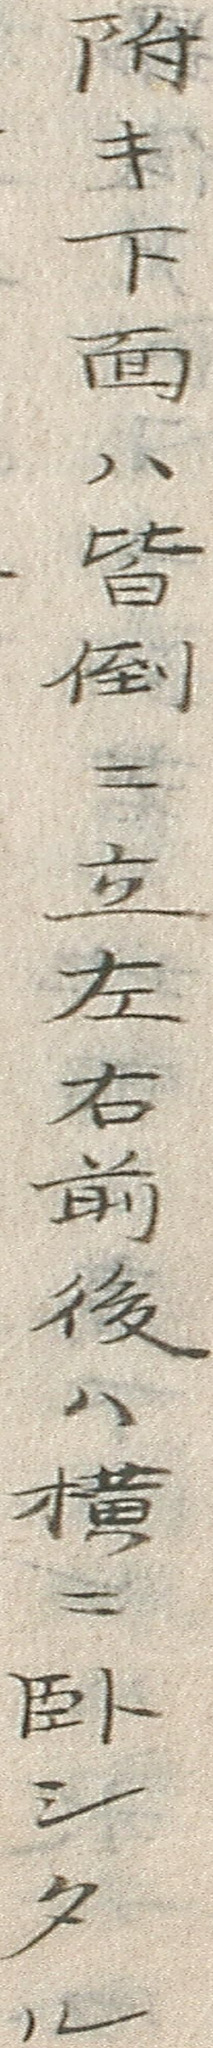附キ下面ハ皆倒ニ立左右前後ハ横ニ臥シタル
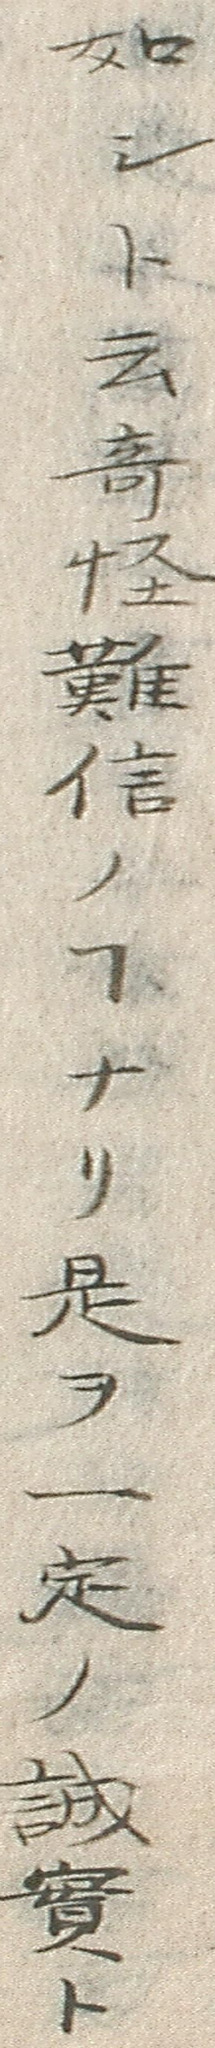如シト云奇怪難信ノコトナリ是ヲ一定ノ誠実ト
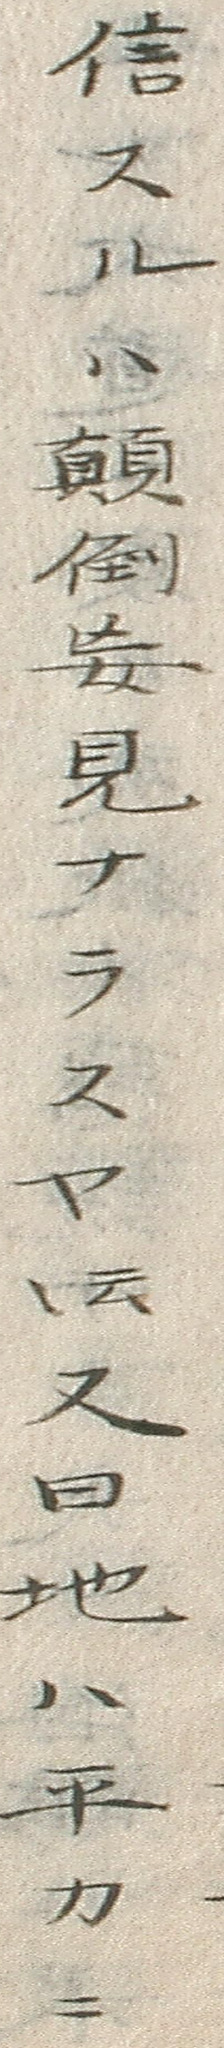信スルハ顛倒妄見ナラスヤ云〻又曰地ハ平カニ
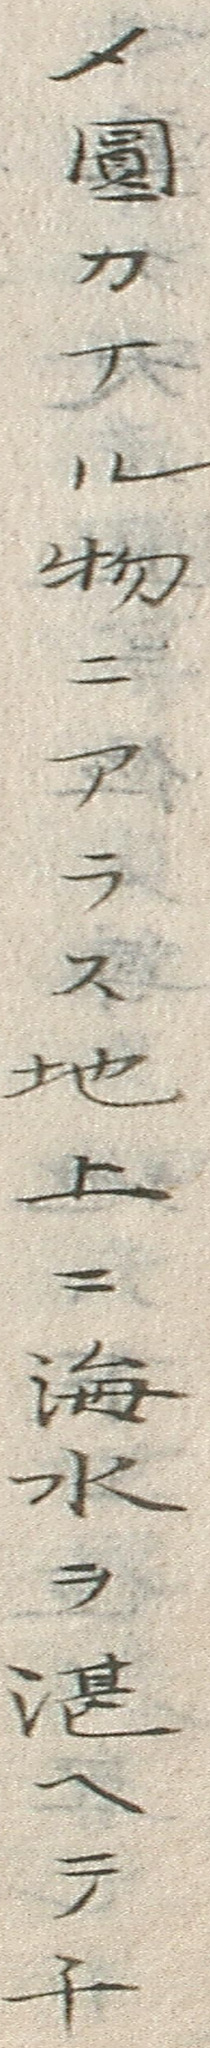シテ円カナル物ニアラス地上ニ海水ヲ湛ヘテ千
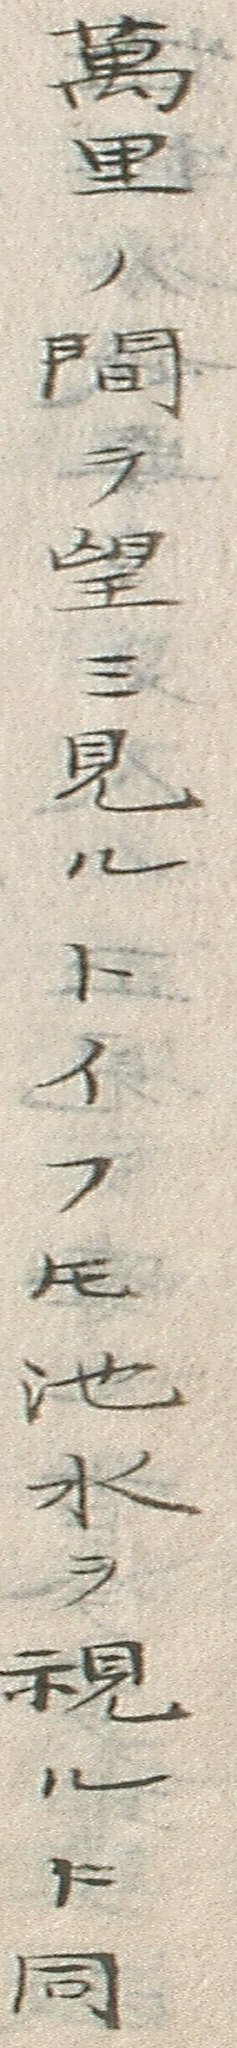万里ノ間ヲ望ミ見ルトイフトモ池水ヲ視ルト同
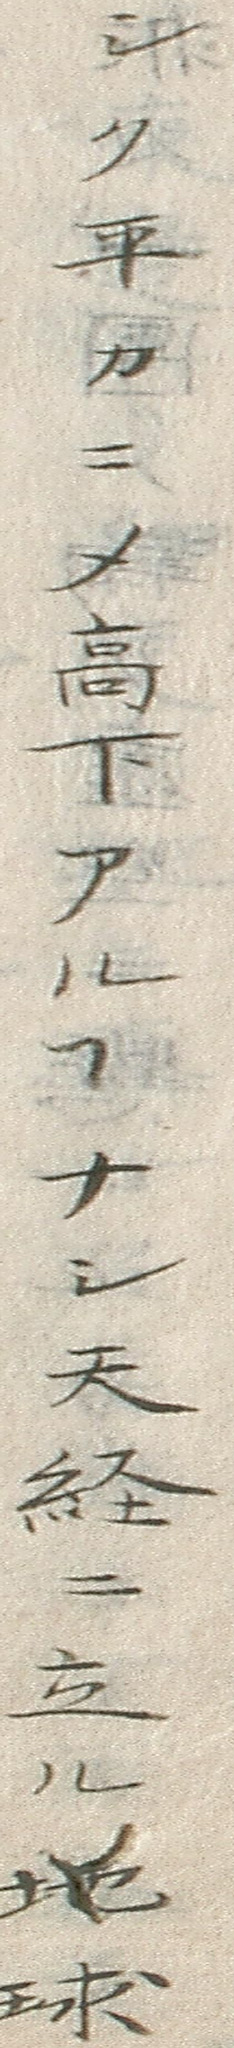シク平カニシテ高下アルコトナシ天経ニ立ル地球
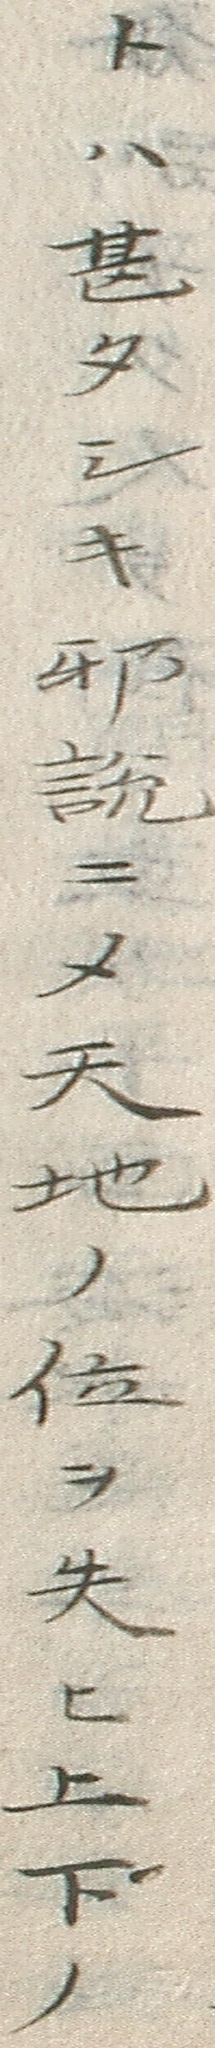トハ甚タシキ邪説ニシテ天地ノ位ヲ失ヒ上下ノ

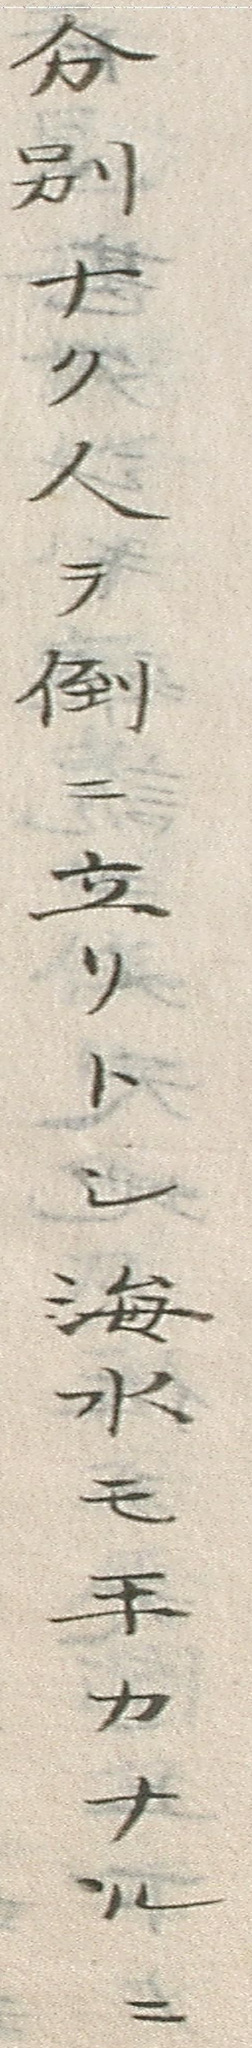分別ナク人ヲ倒ニ立リトシ海水モ平カナルニ
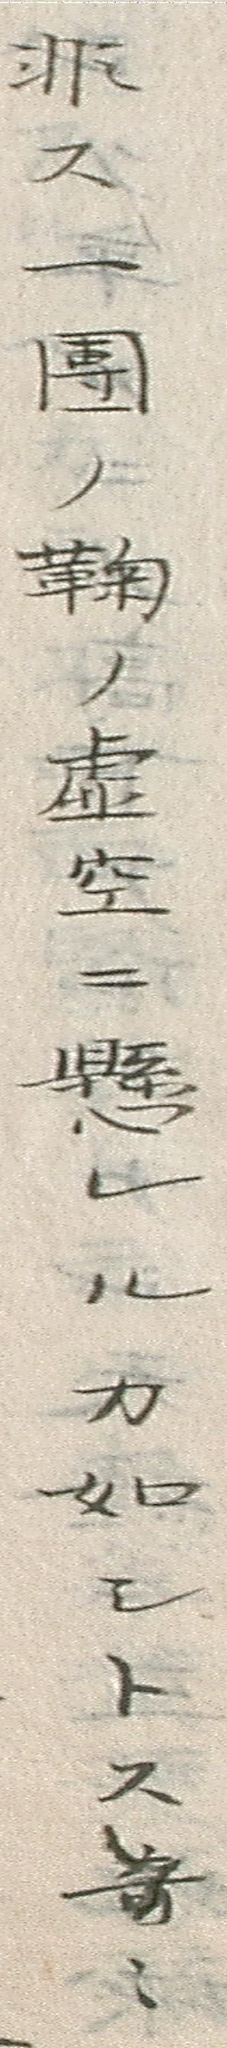非ス一団ノ鞠ノ虚空ニ懸レルカ如シトス奇〻
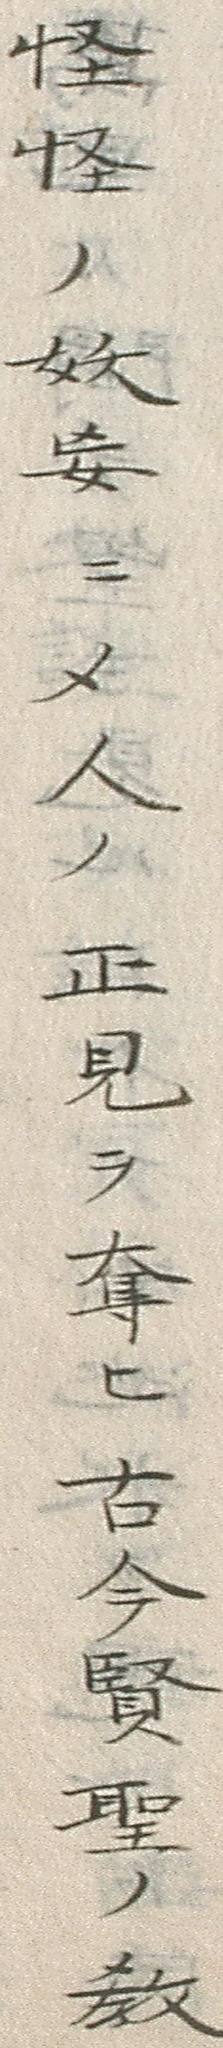怪怪ノ妖妄ニシテ人ノ正見ヲ奪ヒ古今賢聖ノ教
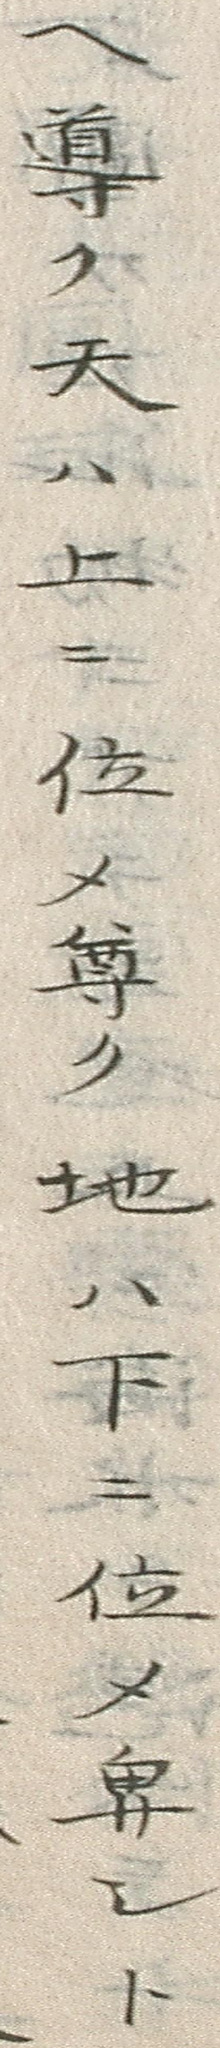ヘ導ク天ハ上ニ位シテ尊ク地ハ下ニ位シテ卑シト
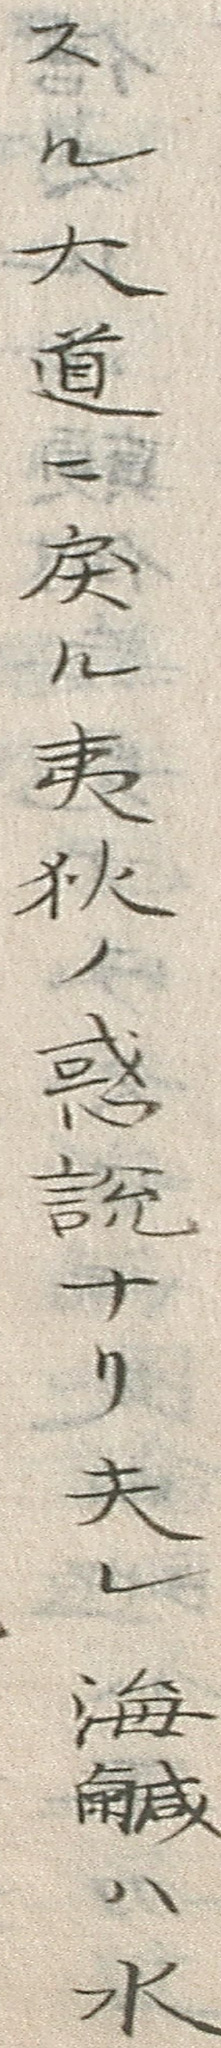スル大道ニ戻ル夷狄ノ惑説ナリ夫レ海鹹ハ水
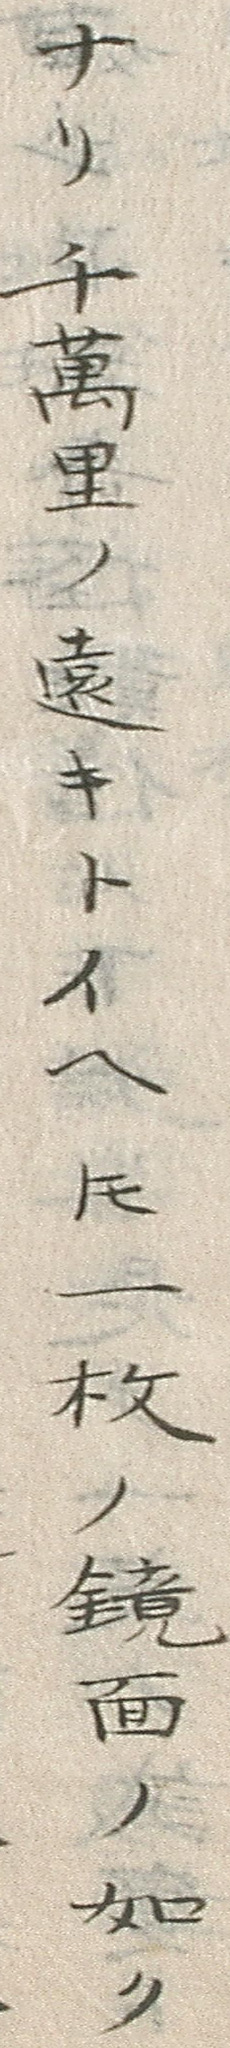ナリ千万里ノ遠キトイヘトモ一枚ノ鏡面ノ如ク
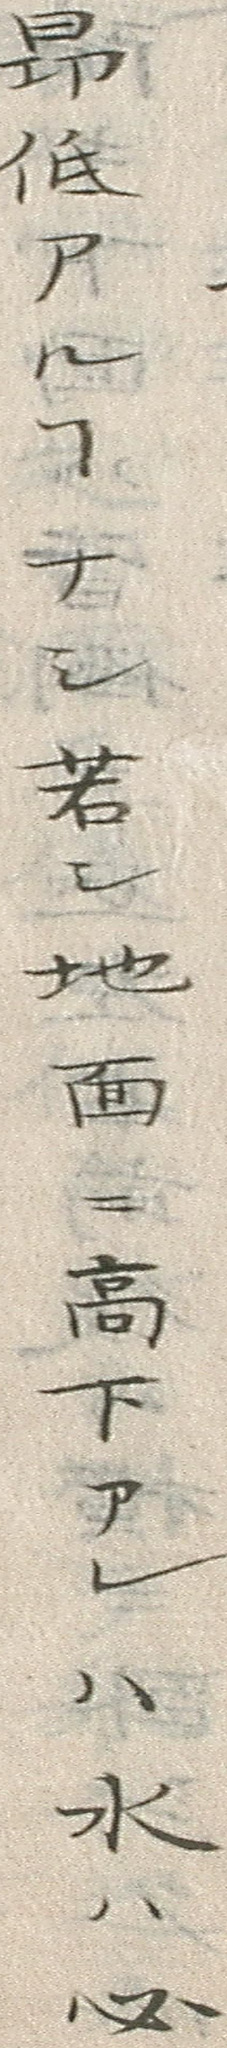昂低アルコトナシ若シ地面ニ高下アレハ水ハ必
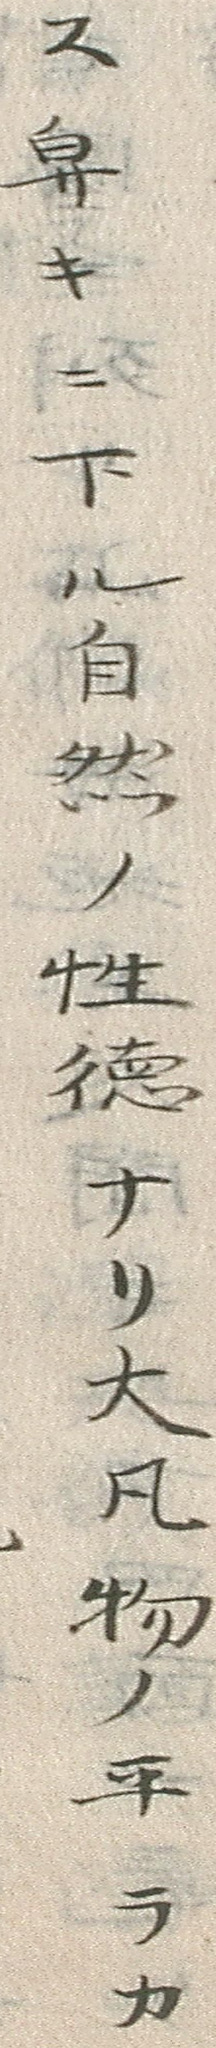ス卑キニ下ル自然ノ性徳ナリ大凡物ノ平ラカ
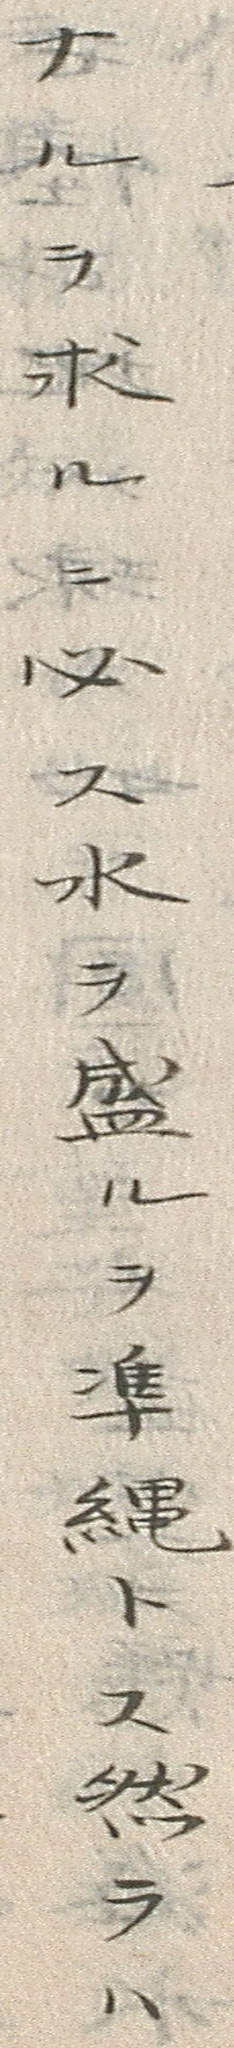ナルヲ求ルニ必ス水ヲ盛ルヲ準縄トス然ラハ
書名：天學略名目羽翼　全
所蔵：東京大学地震研究所図書室 Earthquake Research Institute Library, The University of Tokyo, JAPAN
